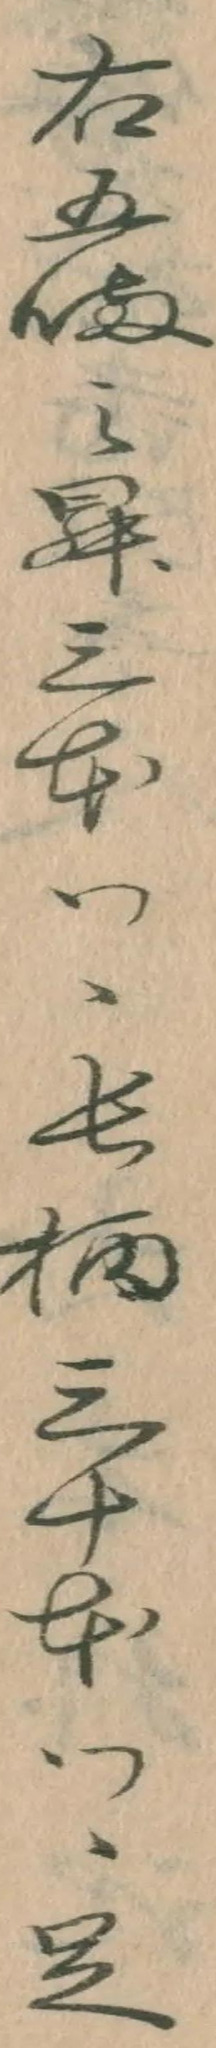右五備之昇三本つゝ長柄三十本つゝ足
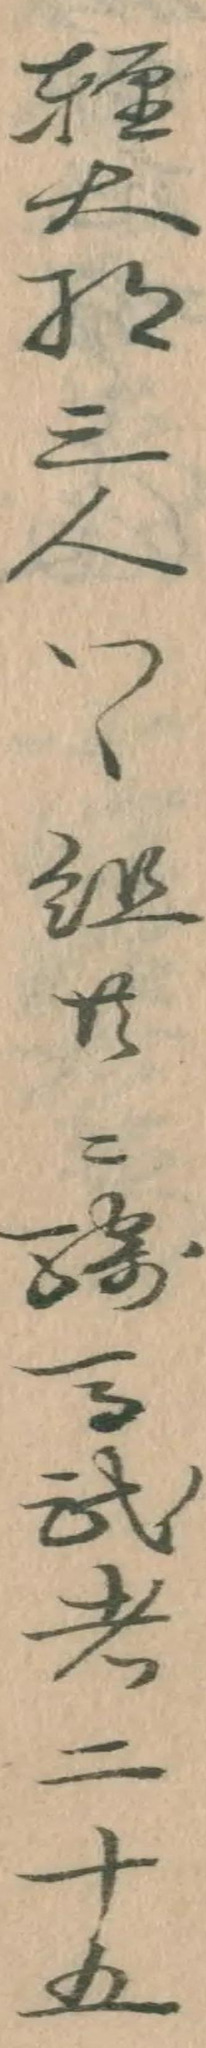軽大将三人つゝ組共に騎馬武者二十五
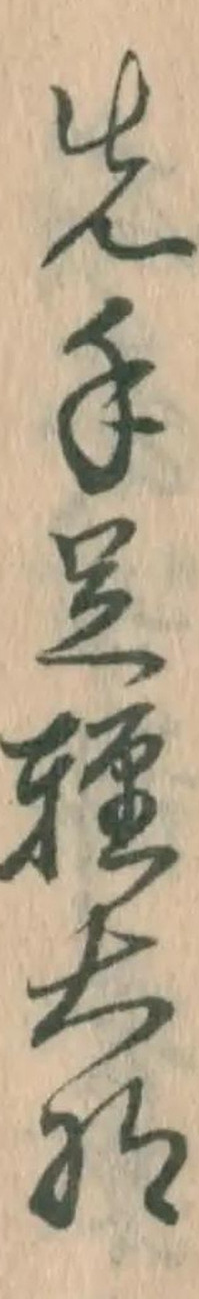先手足軽大将
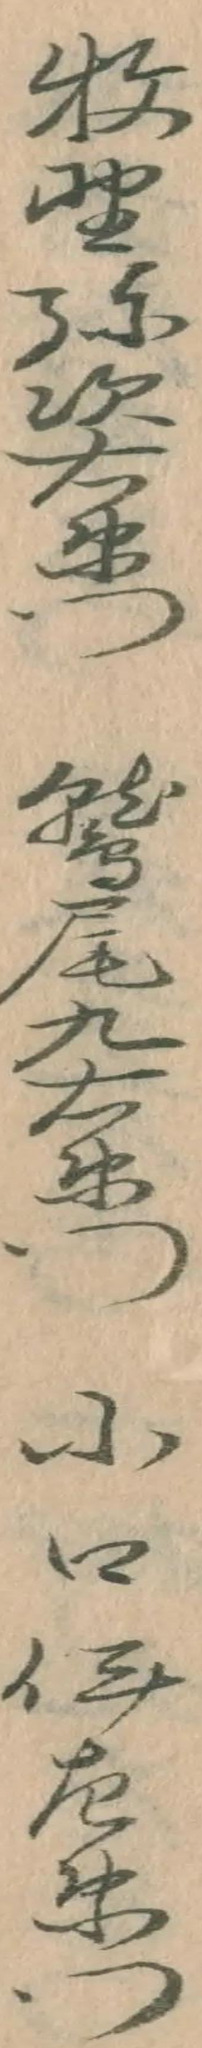牧野弥次右衛門鷲尾九右衛門小口伊左衛門
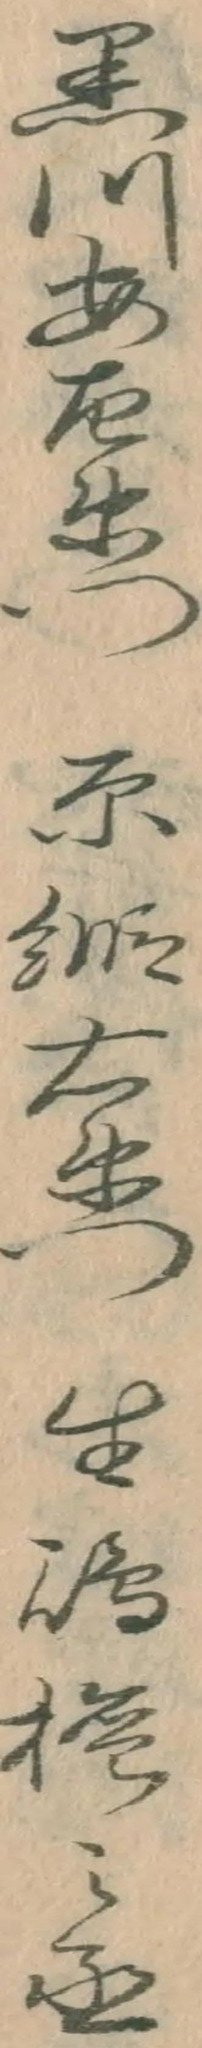黒川安左衛門原緞右衛門生島権之丞

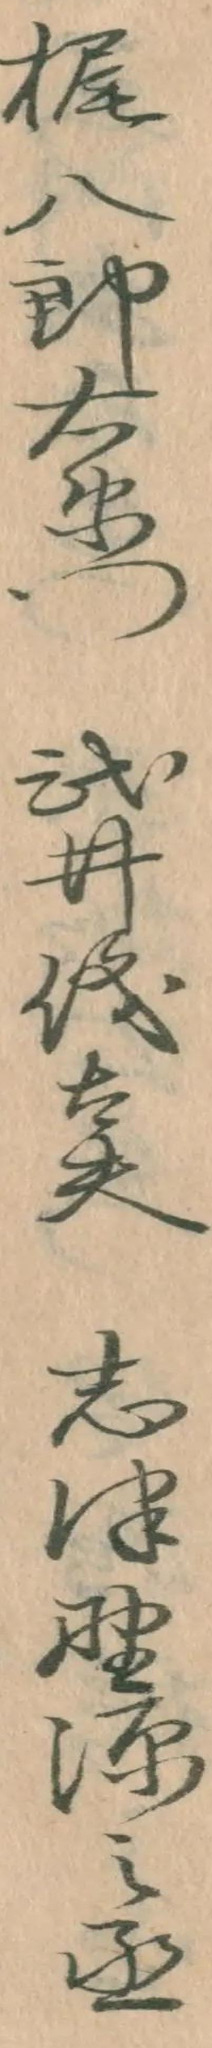梶八郎右衛門武井儀太夫志津野源之丞
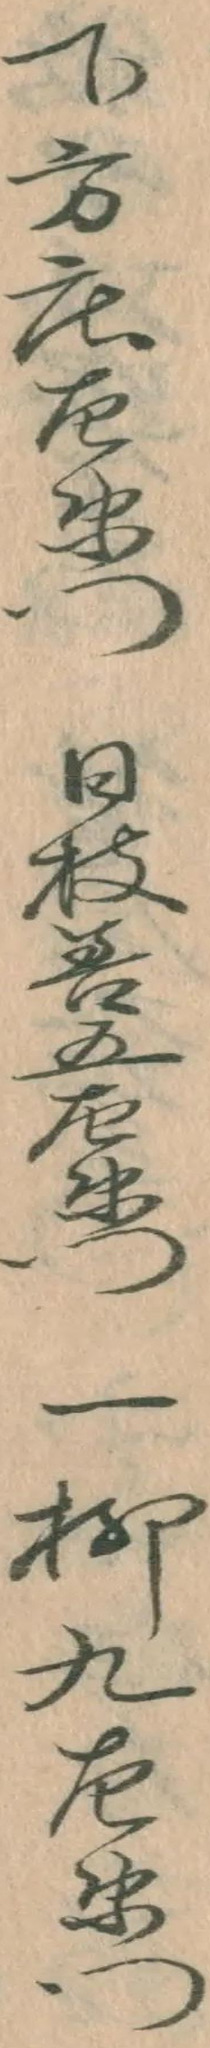下方庄左衛門日枝善五左衛門一柳九左衛門
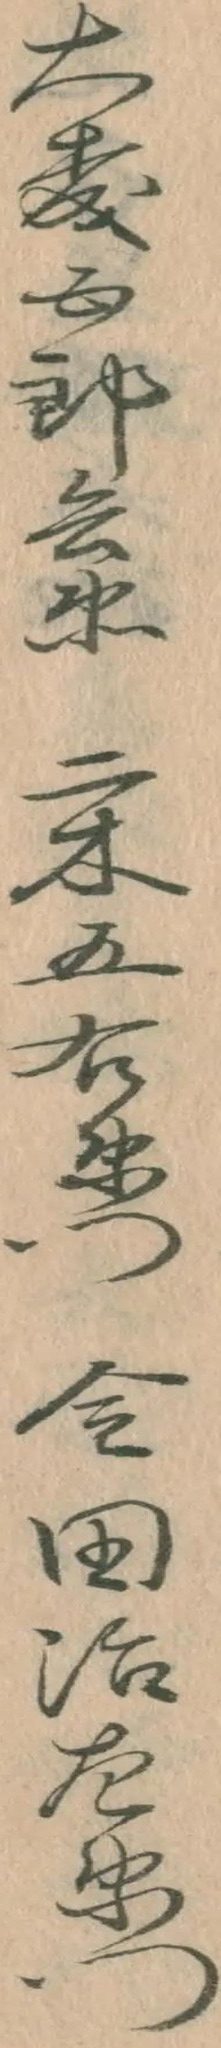大森五郎兵衛二木五右衛門金田治左衛門
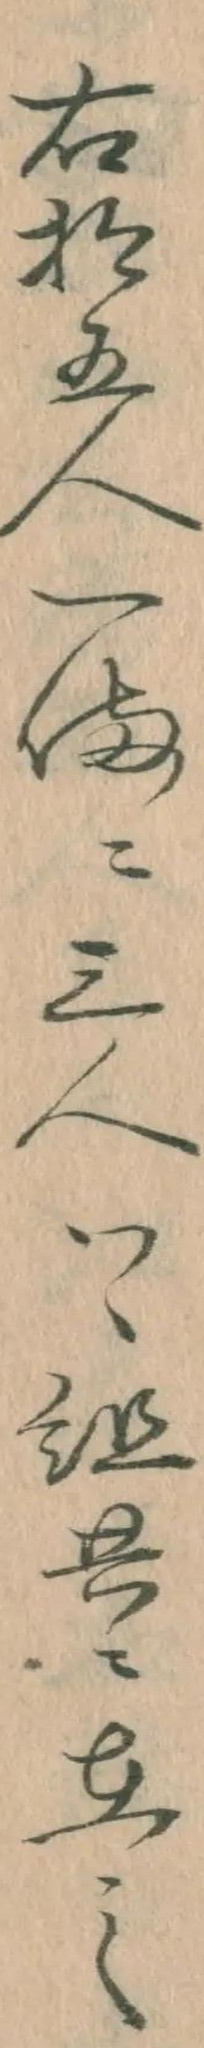右拾五人一備に三人つゝ組共に在之
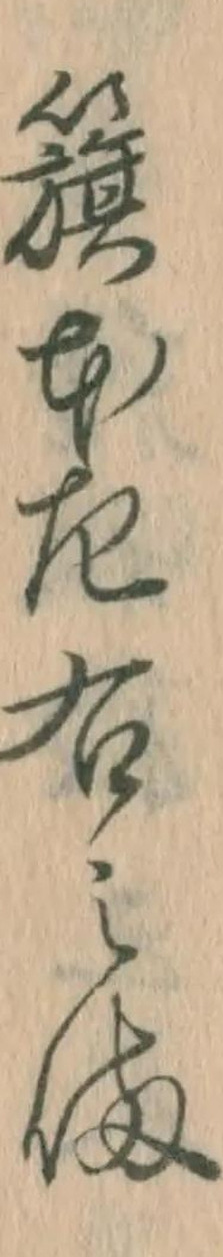籏本佐右之備
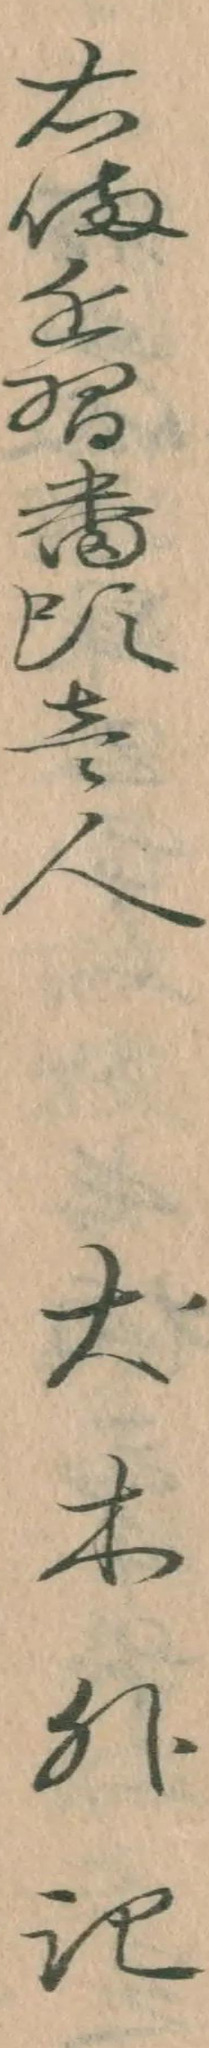右備近習番頭壱人大木外記
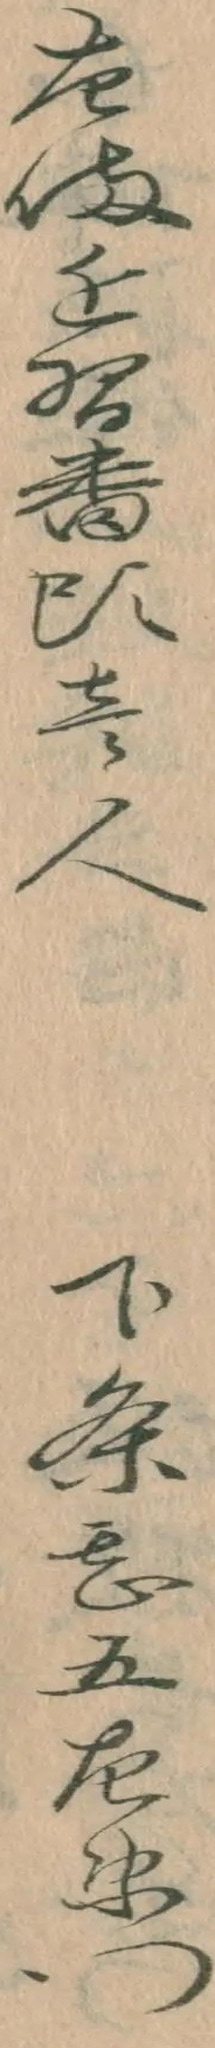左備近習番頭壱人下条甚五左衛門
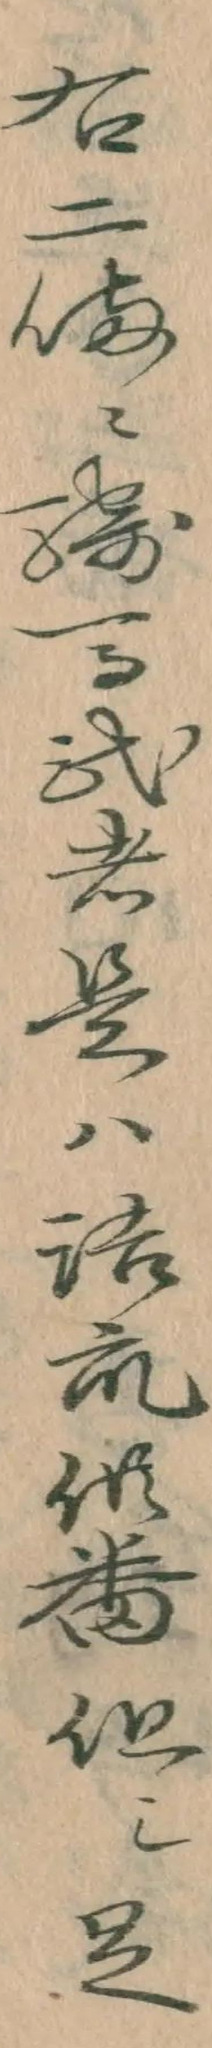右二備に騎馬武者是は詰衆供番但し足
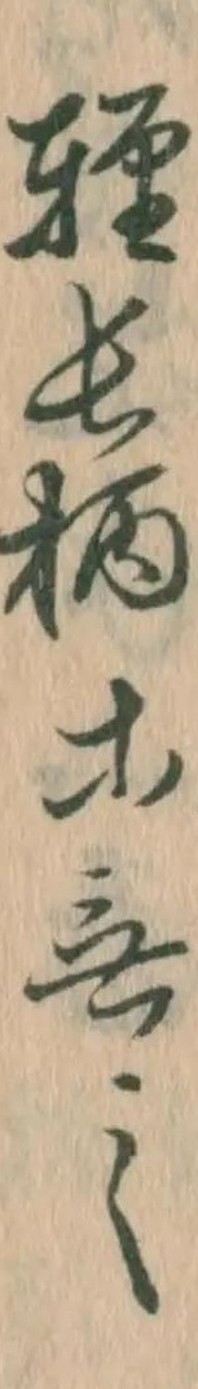軽長柄等無之
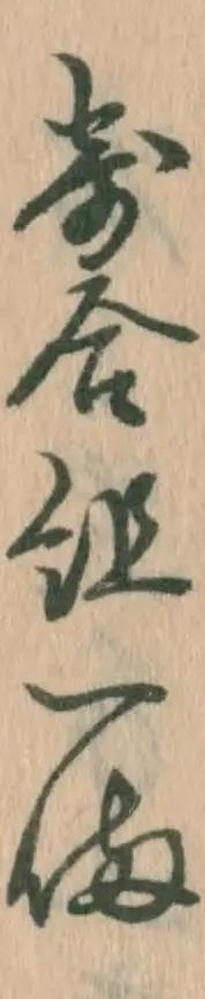寄合組一備
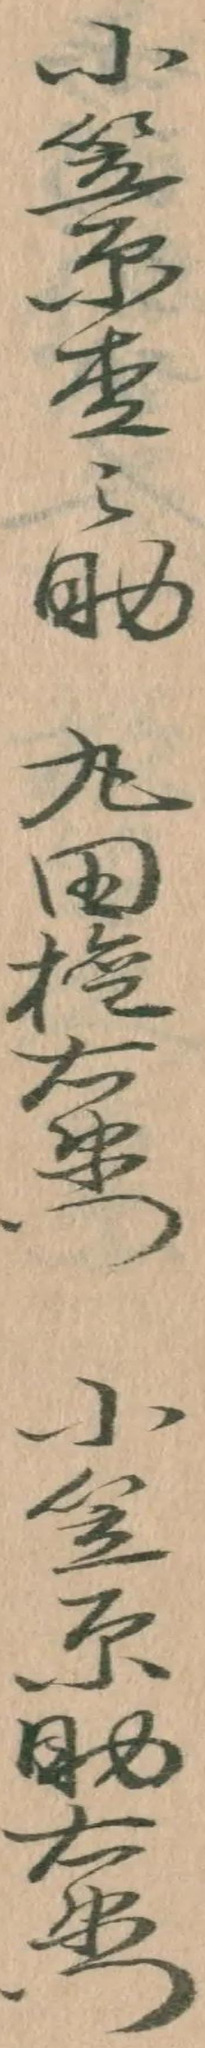小笠原杢之助丸田権右衛門小笠原助右衛門
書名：切支丹御退治記 49巻. [6]
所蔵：国立国会図書館 National Diet Library, JAPAN
